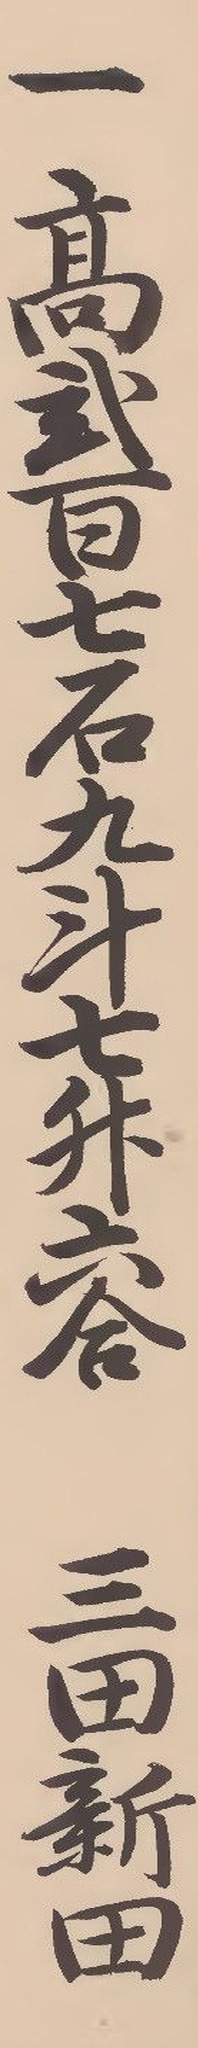一高弐百七石九斗七升六合三田新田
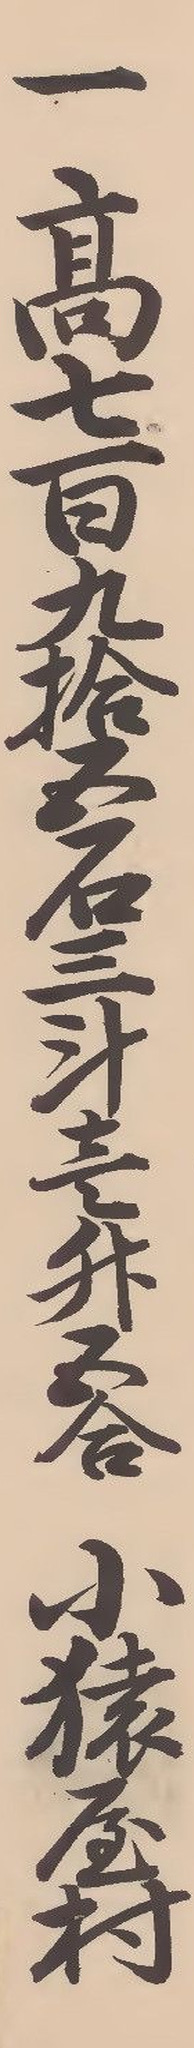一高七百九拾五石三斗壱升五合小猿屋村
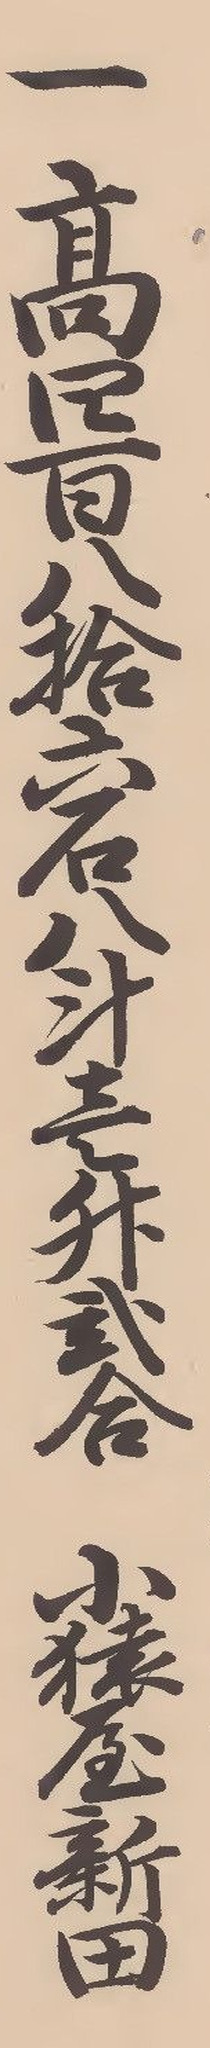一高四百八拾六石八斗壱升弐合小猿屋新田
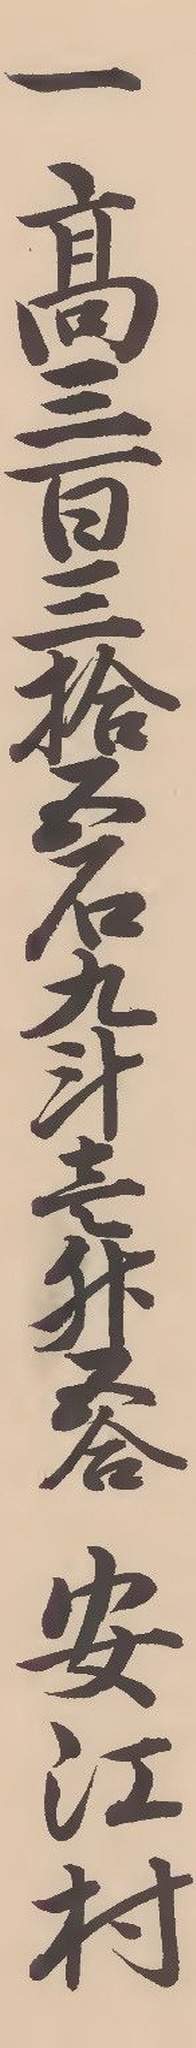一高三百三拾五石九斗壱升五合安江村

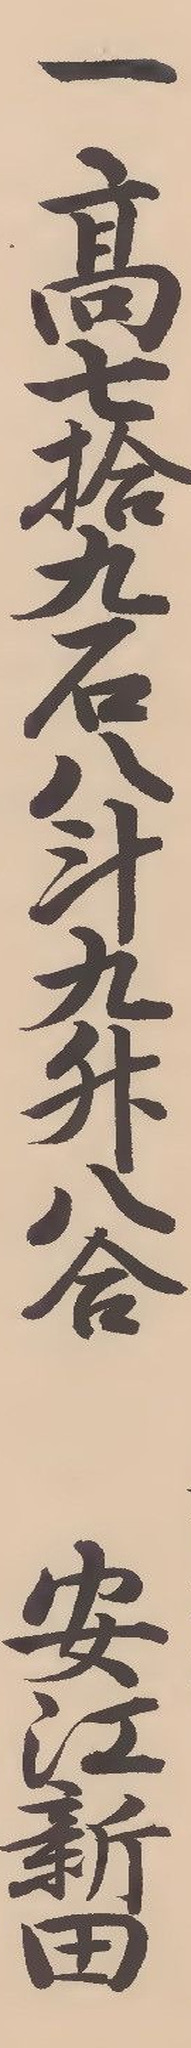一高七拾九石八斗九升八合安江新田
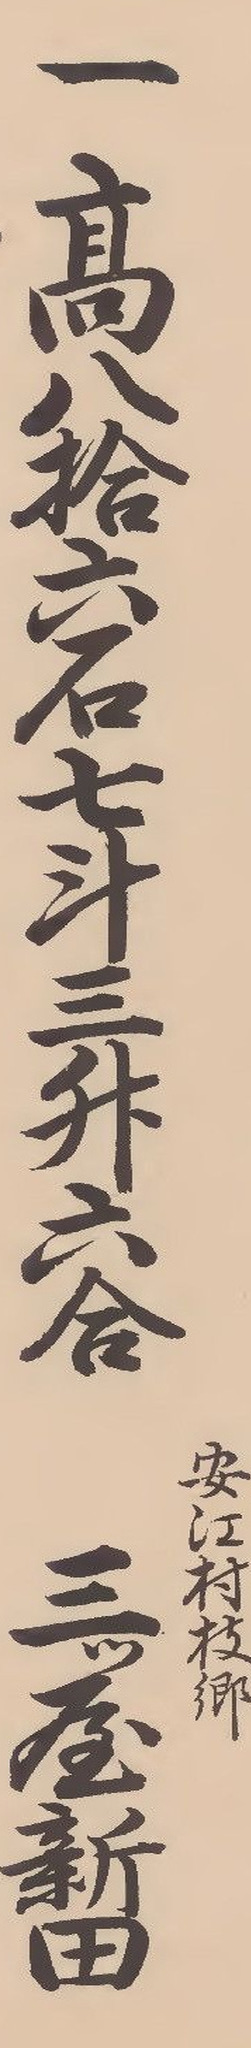一高八拾六石七斗三升六合三ツ屋新田
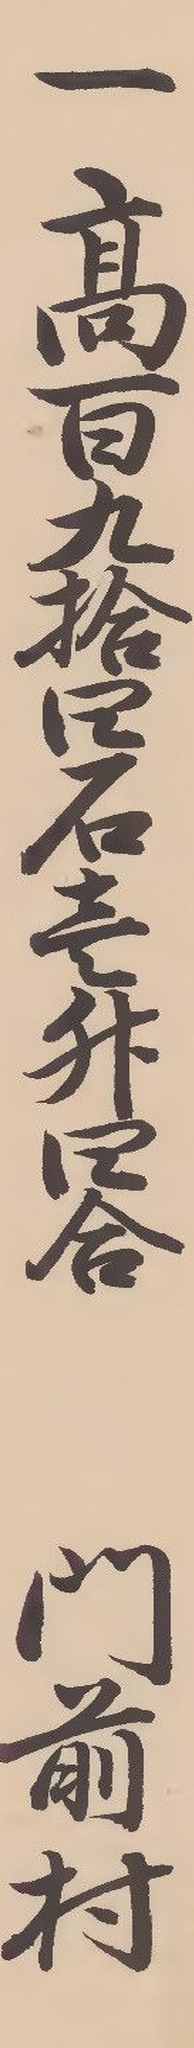一高百九拾四石壱升四合門前村
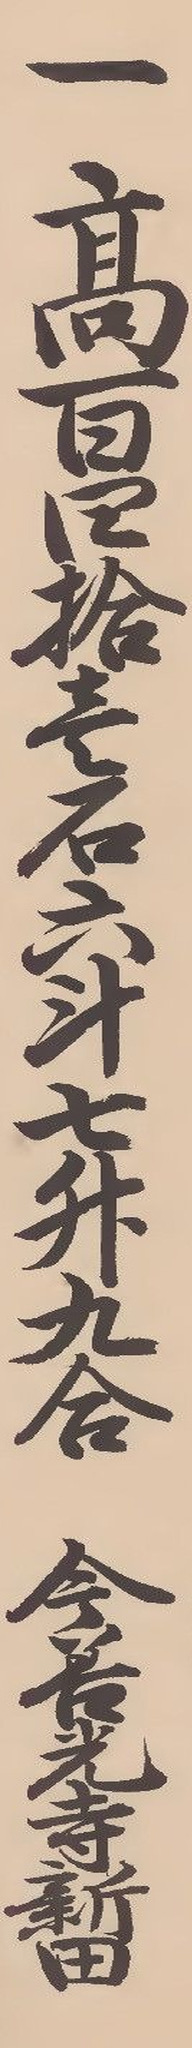一高百四拾壱石六斗七升九合今善光寺新田
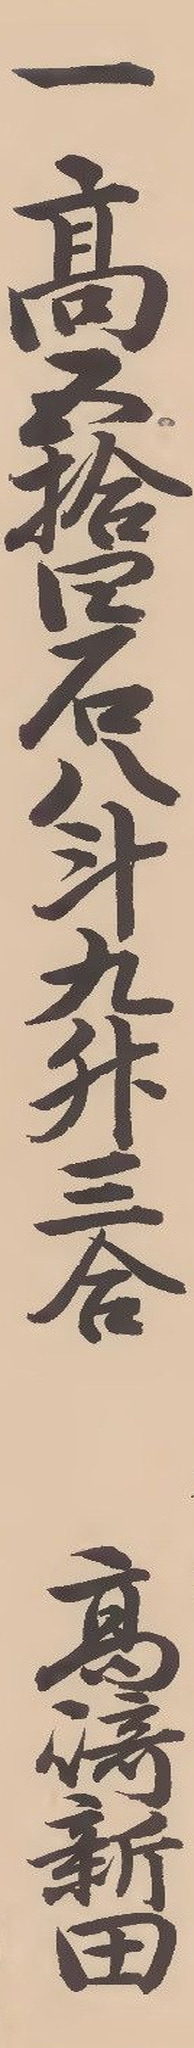一高五拾四石八斗九升三合高崎新田
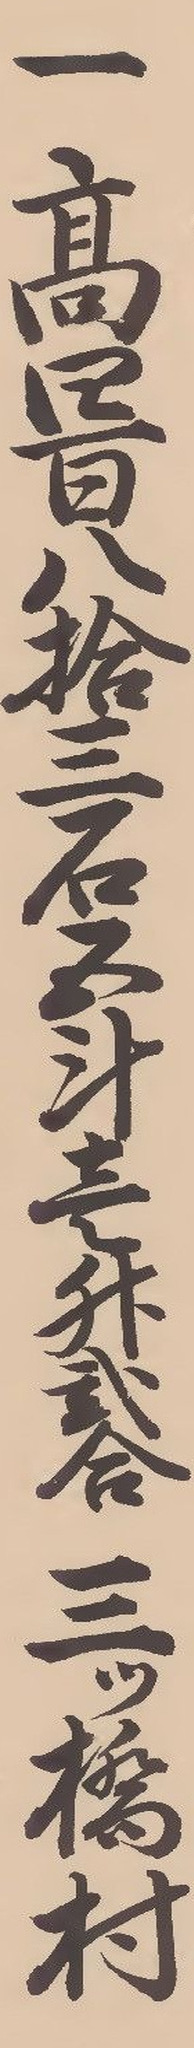一高四百八拾三石五斗壱升弐合三ツ橋村
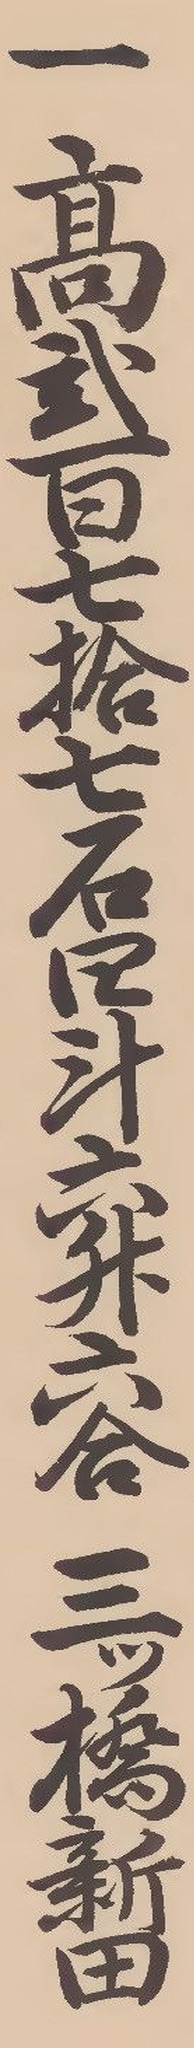一高弐百七拾七石四斗六升六合三ツ橋新田

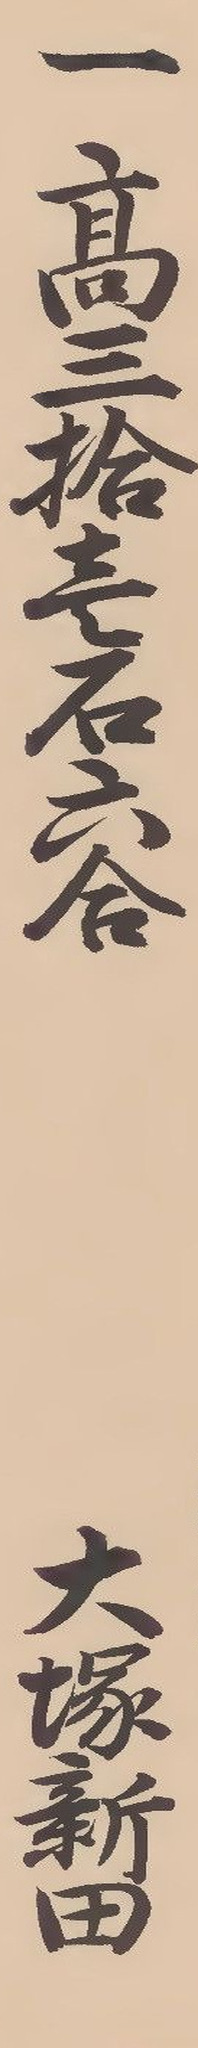一高三拾壱石六合大塚新田
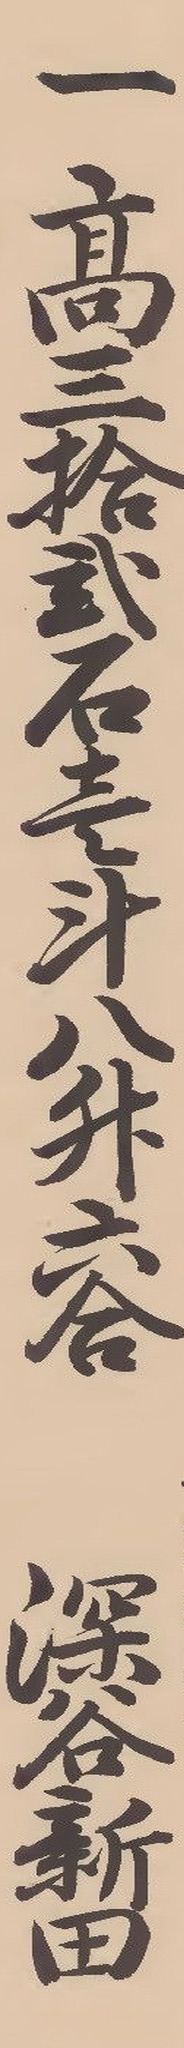一高三拾弐石壱斗八升六合深谷新田
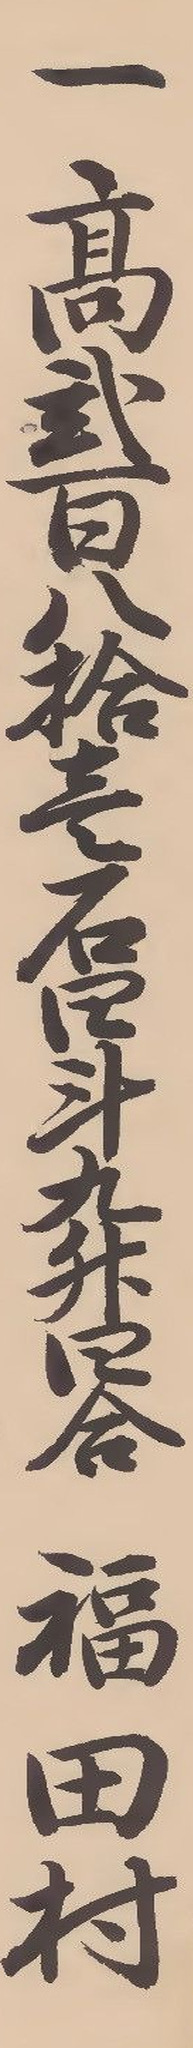一高弐百八拾壱石四斗九升四合福田村
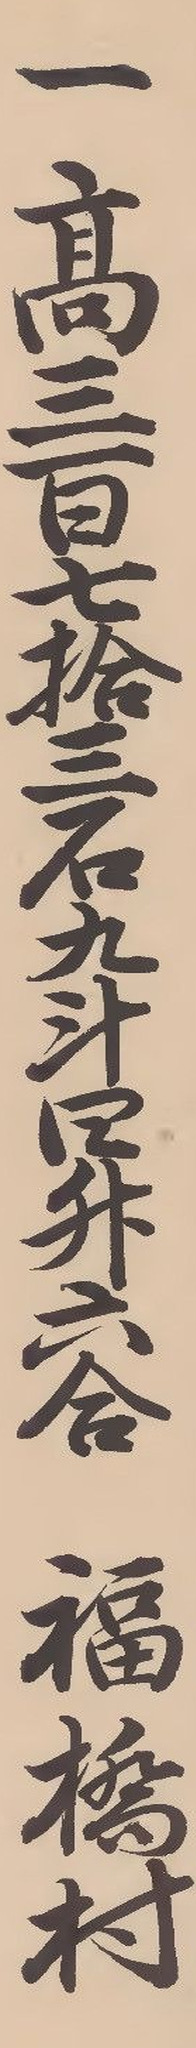一高三百七拾三石九斗四升六合福橋村
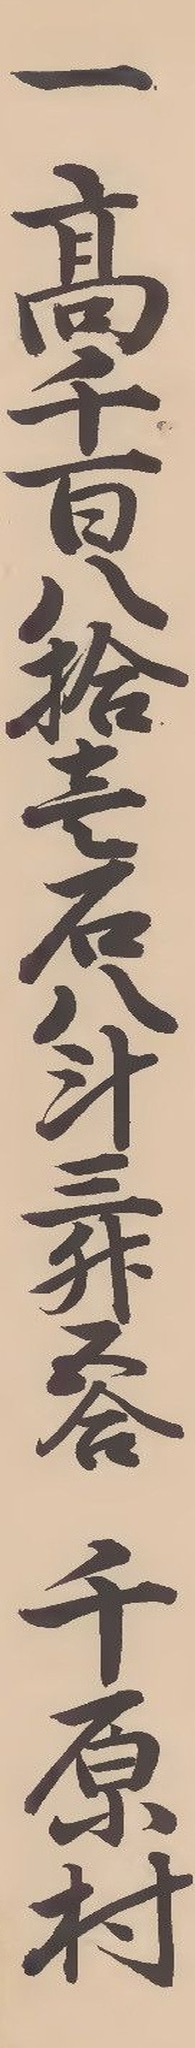一高千百八拾壱石八斗三升五合千原村
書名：越後国郷帳　上
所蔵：国立公文書館 National Archives of Japan
